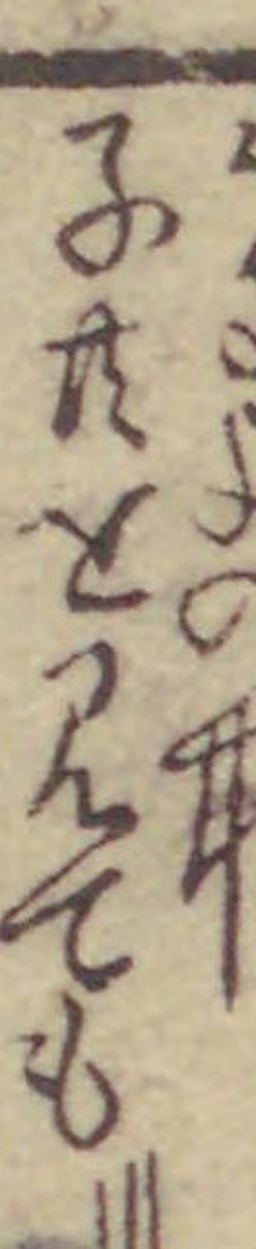子共を見ても
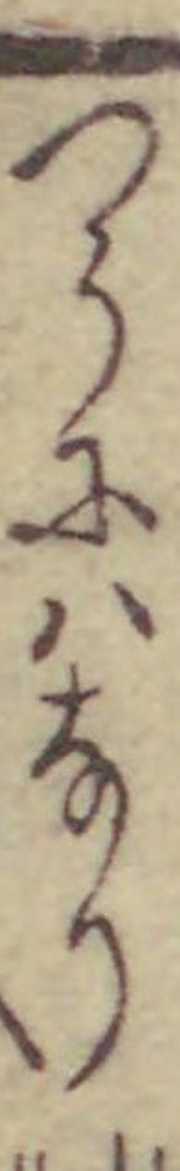つうにはなり

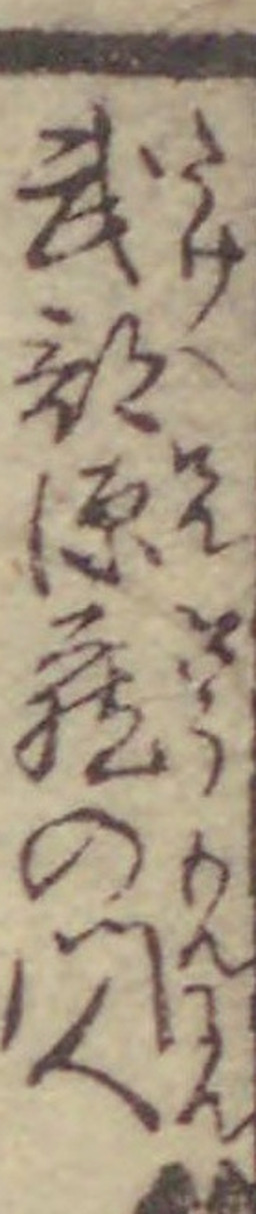武部源蔵の門人
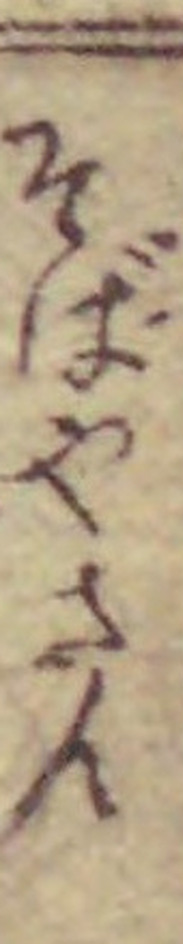そばやさん
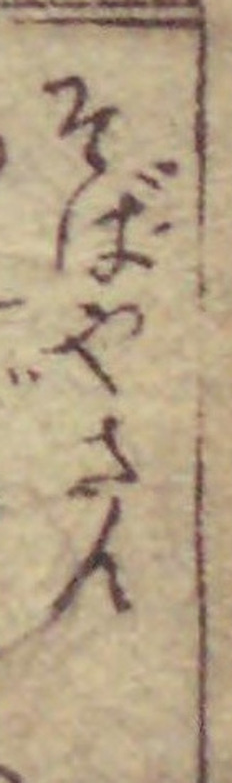そばやさん
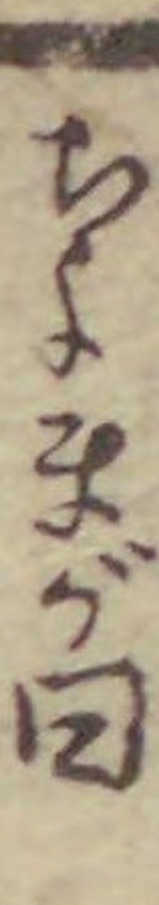ちよまが曰
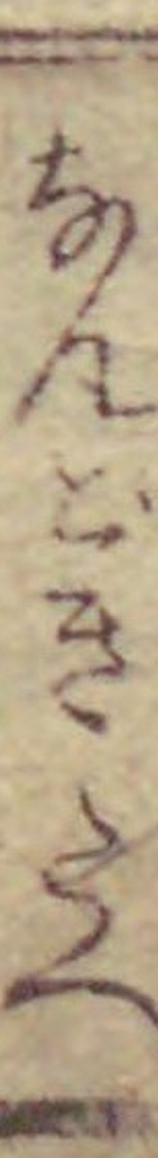なんどきたへ
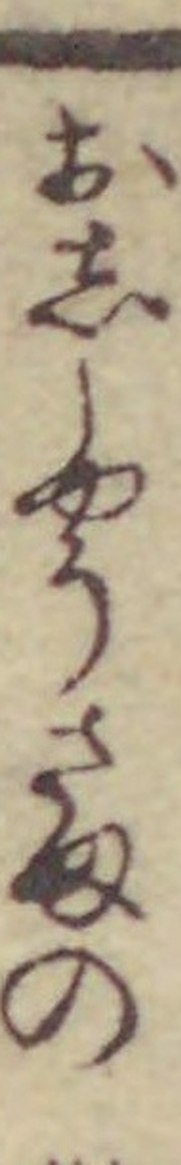おししゃうさまの
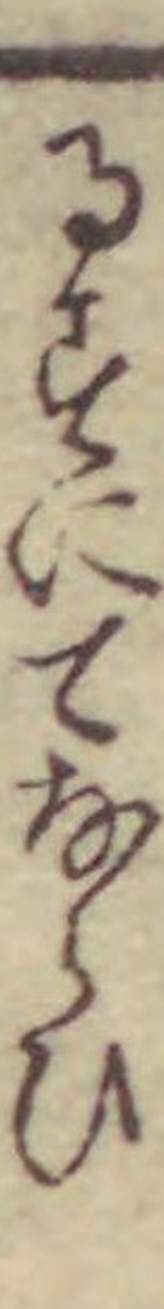るすにてならひ
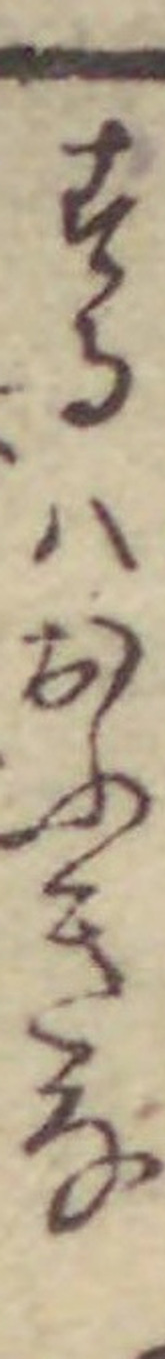するはおふきな
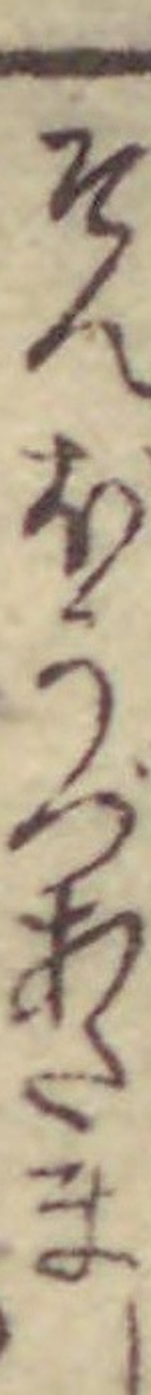そんぼうづあたまの
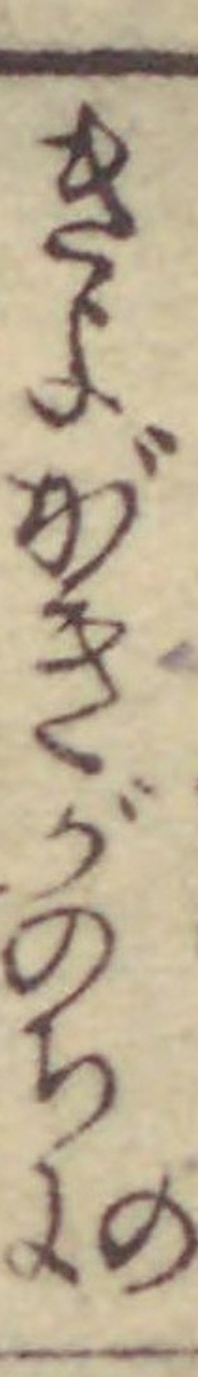きよがきがのちに
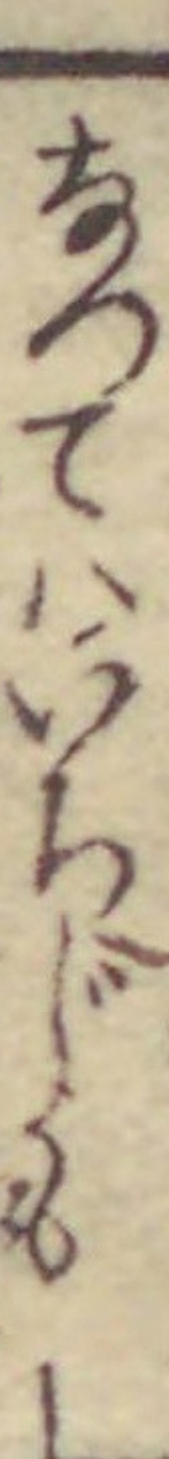なつてはいちじくも
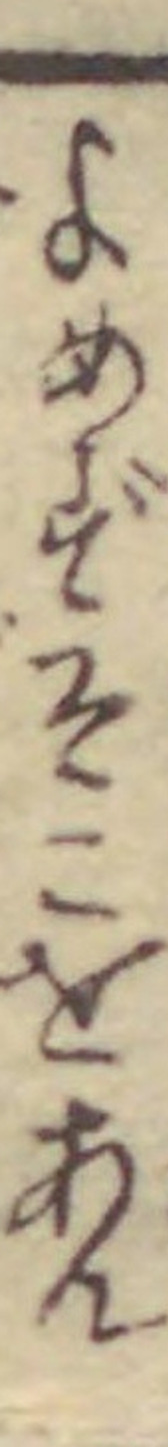よめずそこをあん
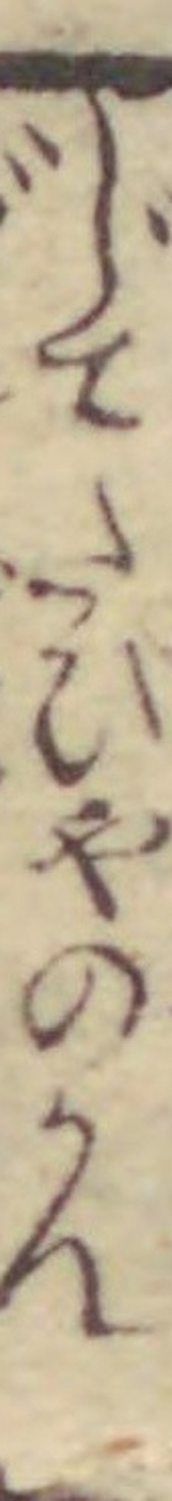じてたびやのかん
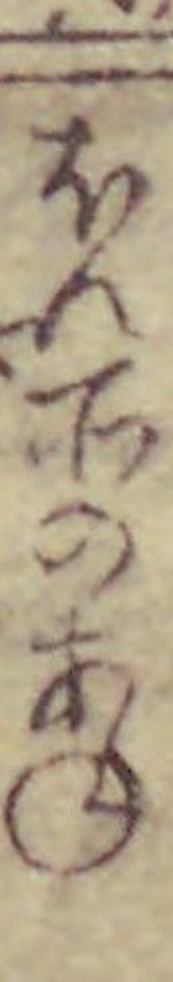ほん所のあね
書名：大通人穴[サガシ] 3巻
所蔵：国立国会図書館 National Diet Library, JAPAN
